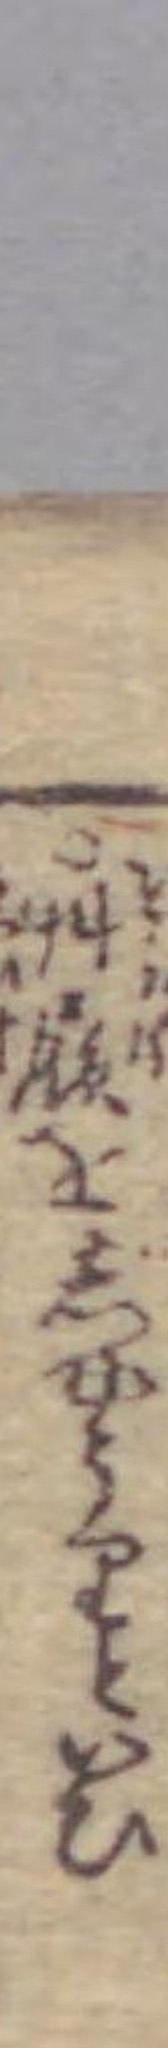○艸履をじやうりといひ
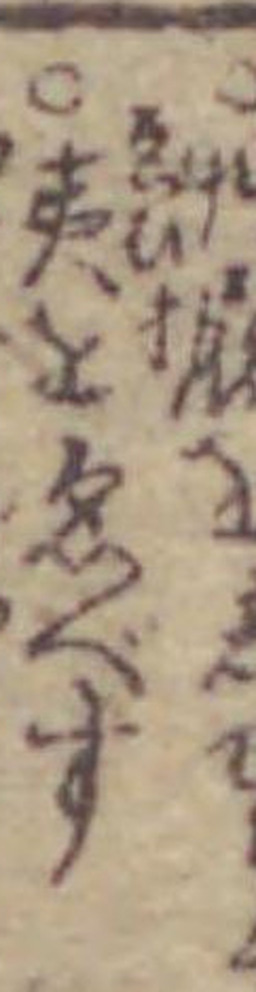○夷をゑべす
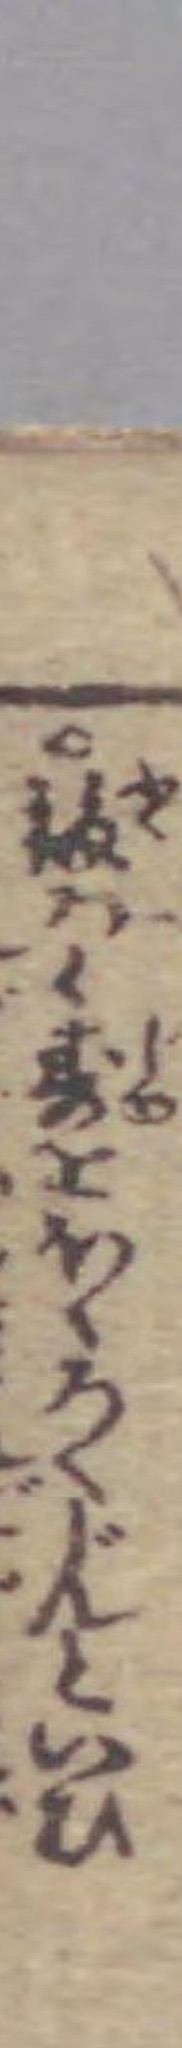○福ろく寿をほくろくじんといひ
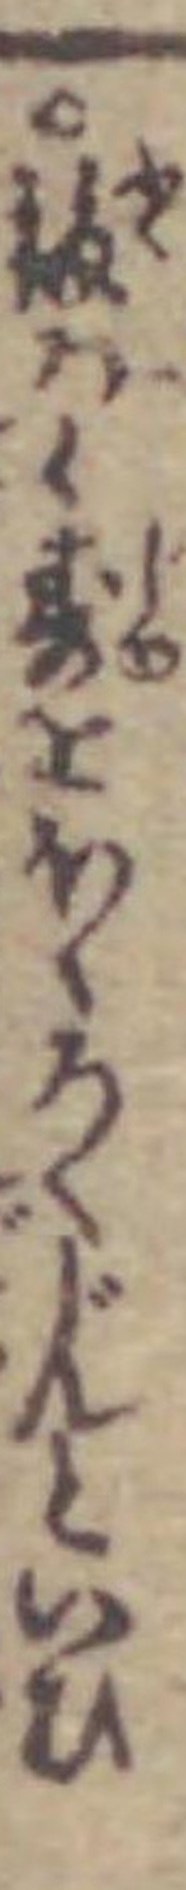○福ろく寿をほくろくじんといひ
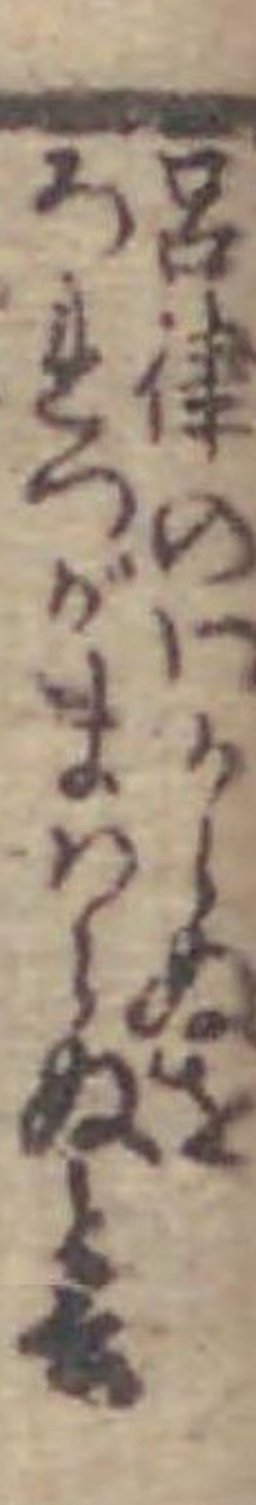ろれつがまはらぬと云
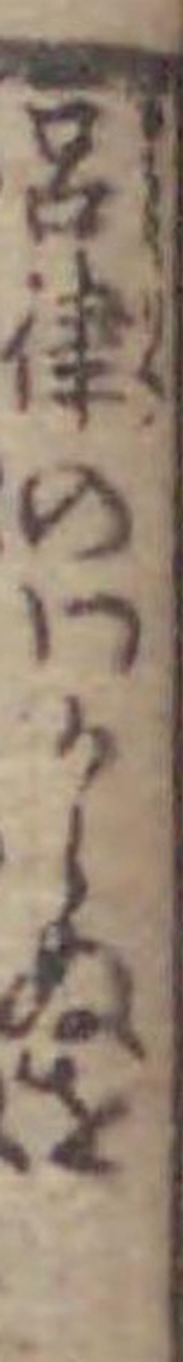呂律のわからぬを
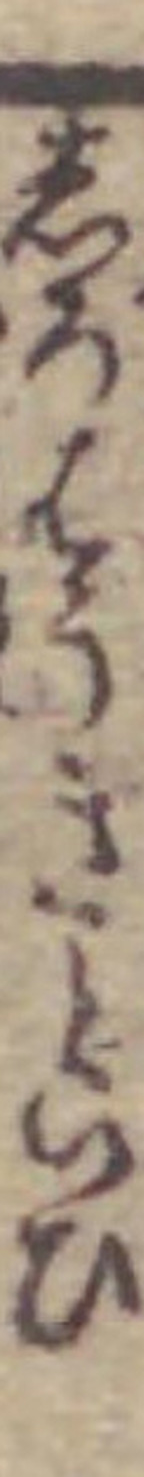しろはうきといひ
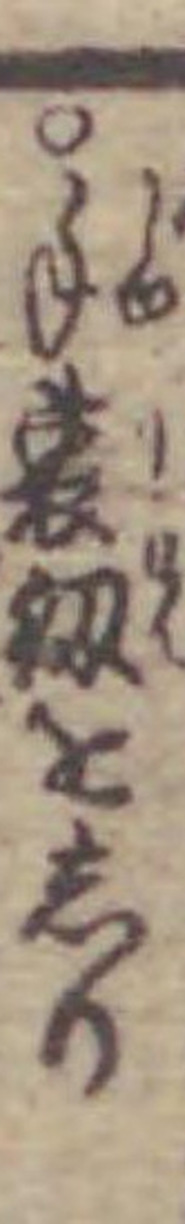○手裏剣をしり
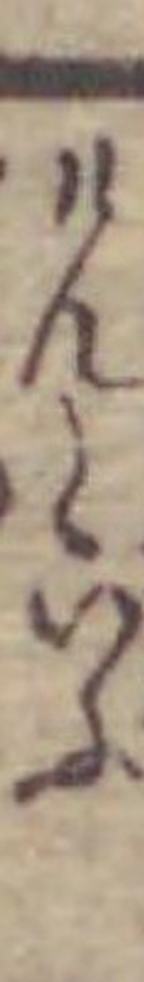けんといふ
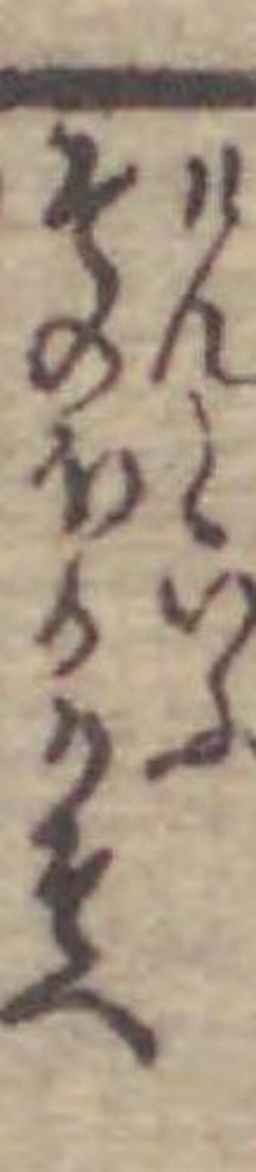そのほかかそへ
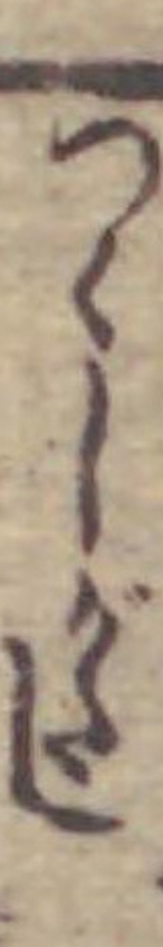つくしがたし
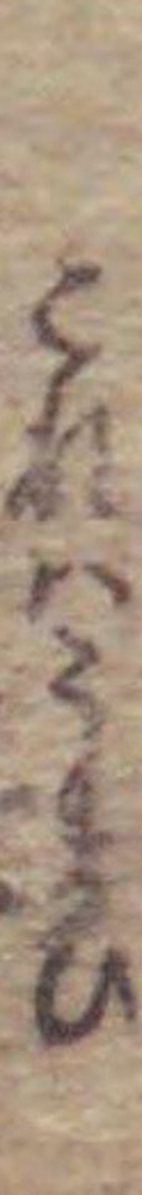これはうまひ

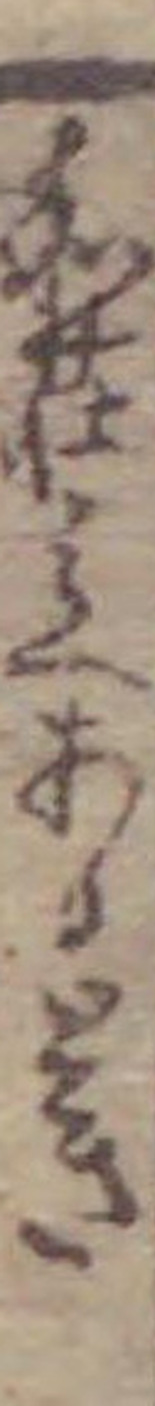和荘兵へあるとき
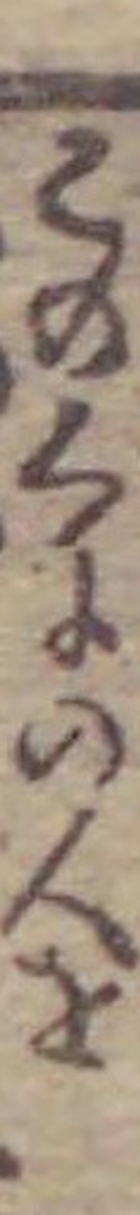このくにの人を
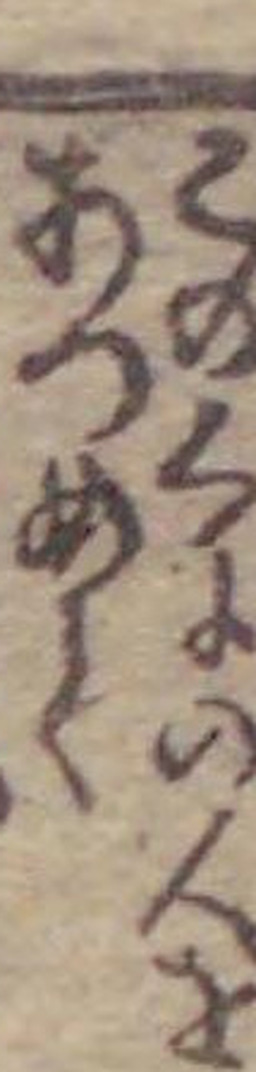あつめて
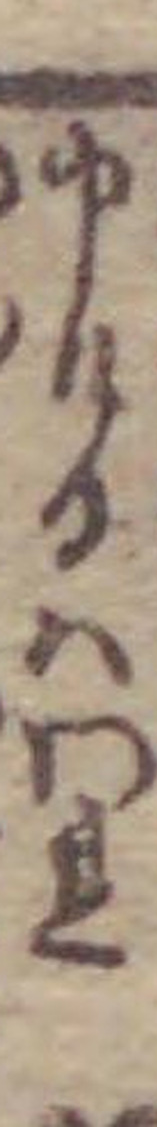申けるはわれ
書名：和荘兵衛後日話 : 3巻
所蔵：国立国会図書館 National Diet Library, JAPAN
